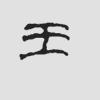王
